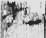九
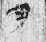月
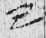己
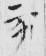亥
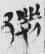○（僕）
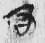君
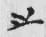之
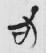右
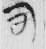司
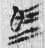馬
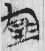○（均）
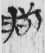戕
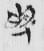受
